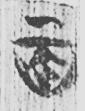百
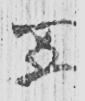五
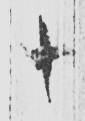十
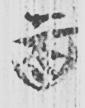百
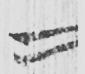二
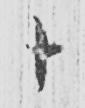十
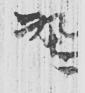九十=
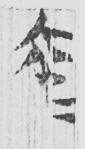六十=
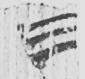三
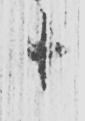十
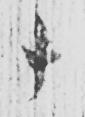十
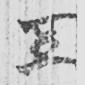五
